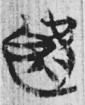既
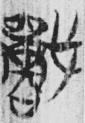○（戰）
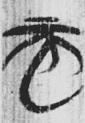而
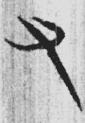又（有）
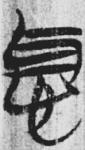殆心
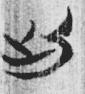此
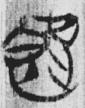既
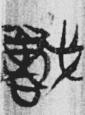○（戰）
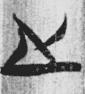之
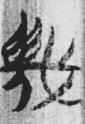幾（忌）
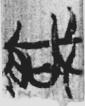戕（莊）
